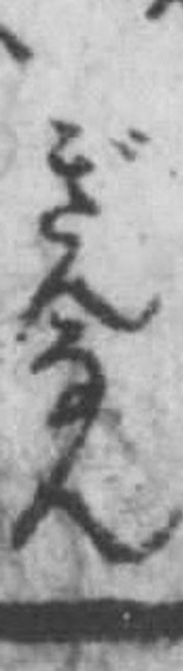ぎんなん
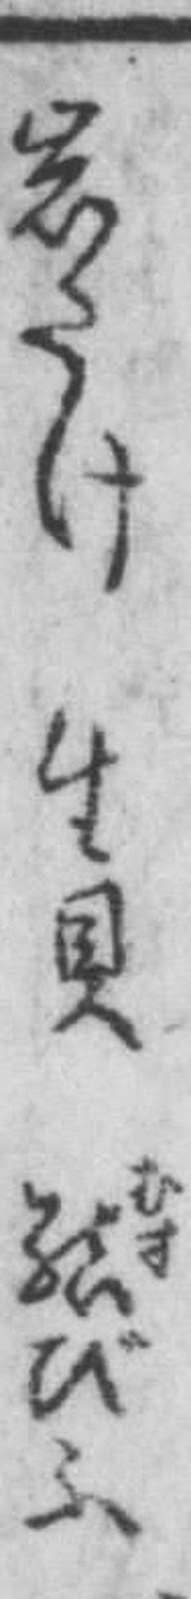岩たけ生貝結びふ
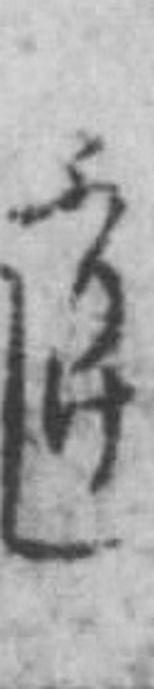ふりけし
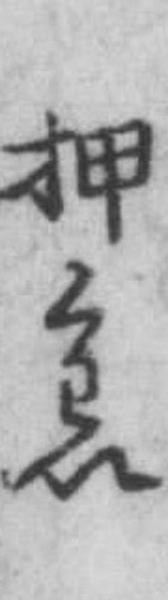豆くわい

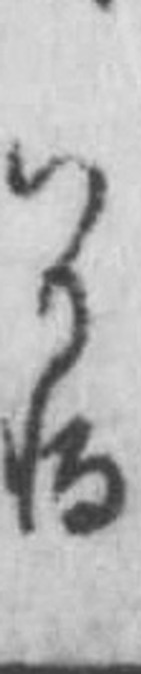いり酒
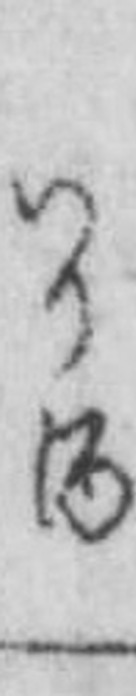いり酒
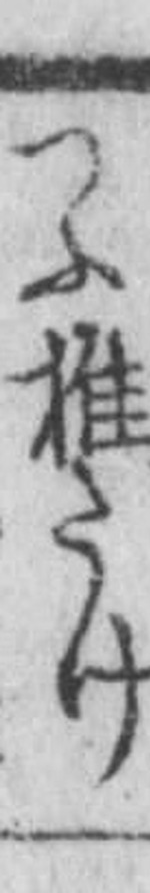用ゆ椎たけ
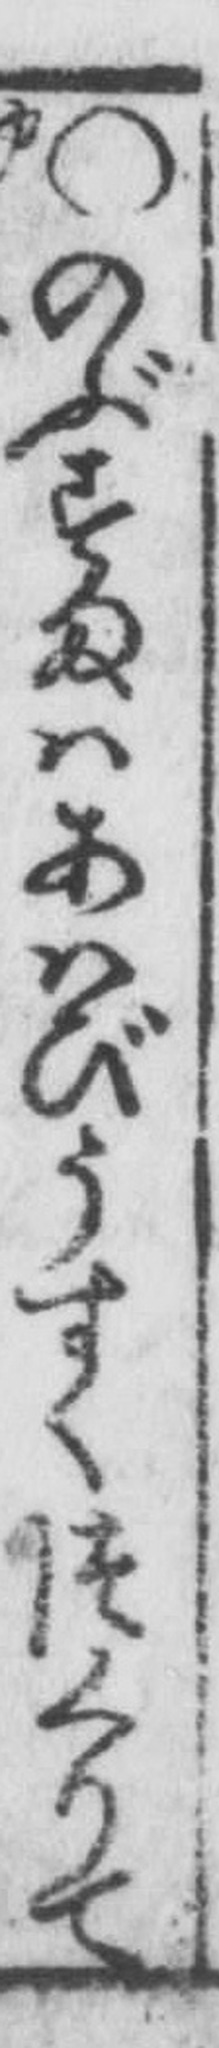〇のぶすまハあハびうすくつくりて
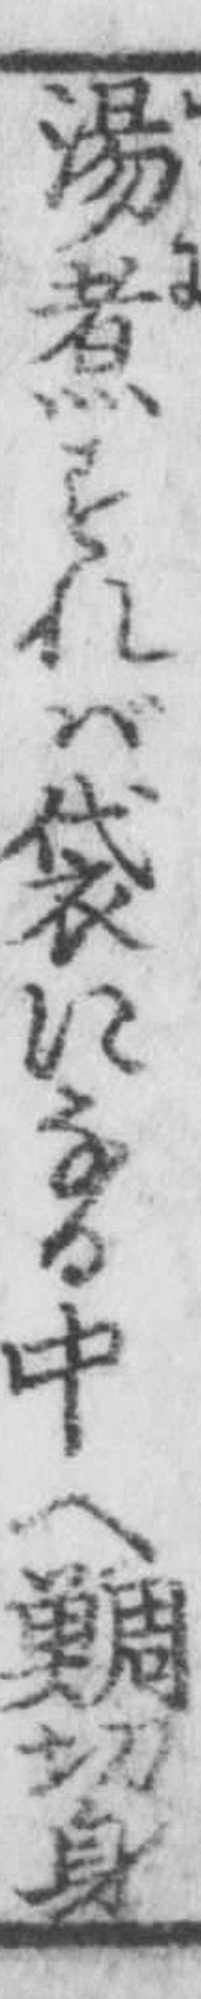湯煮すれバ袋になる中へ鯛切身
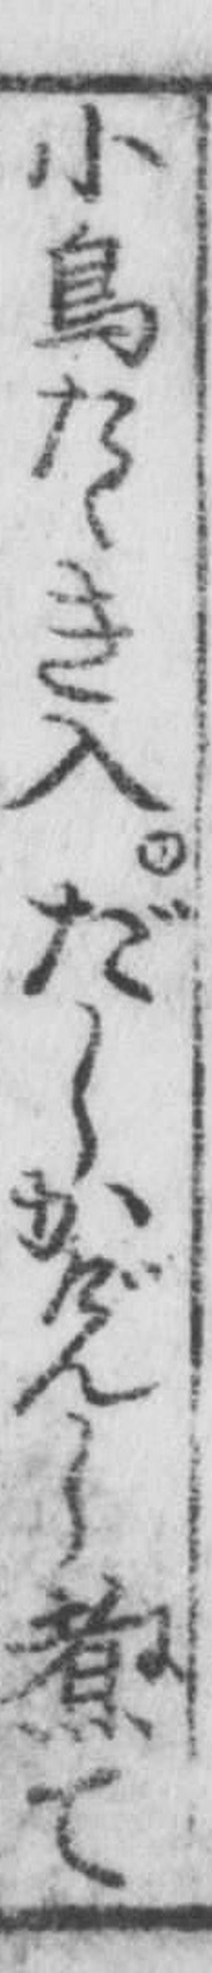小鳥たゝき入れだしかげんし煮て
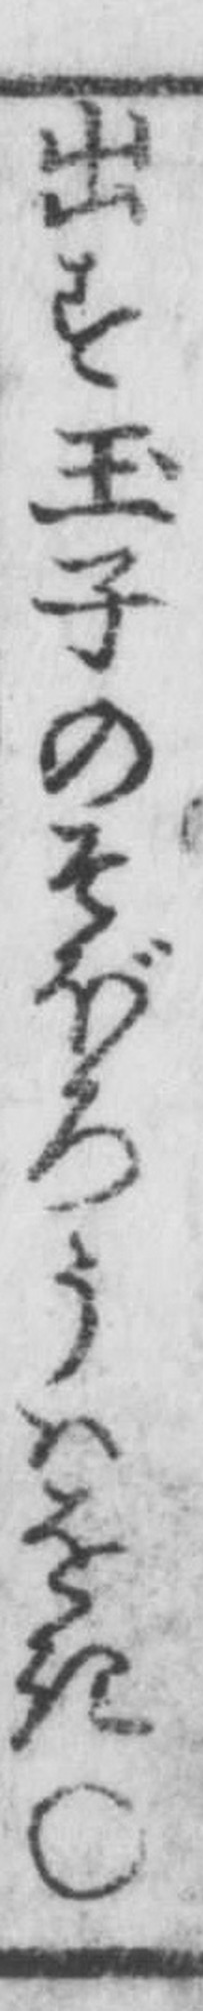出す玉子のそぼろかハをき〇
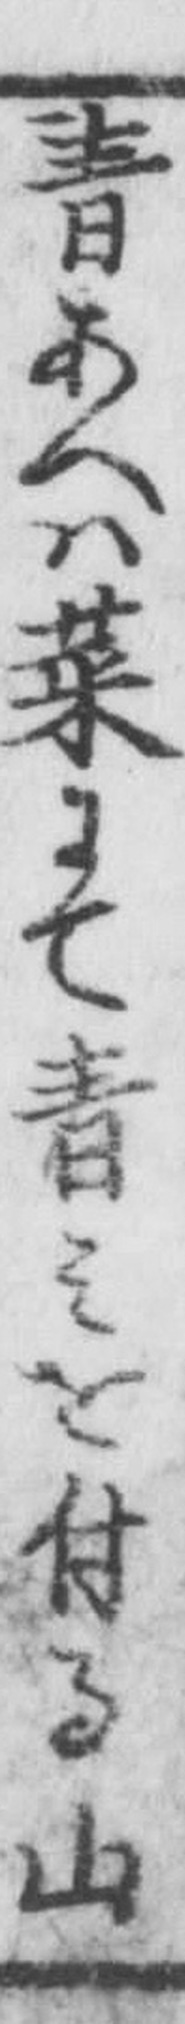青あへハ葉にて青ミ付付け山
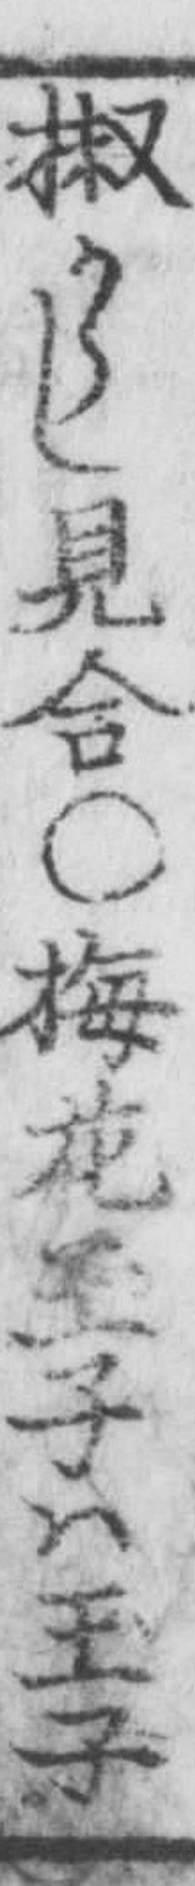椒からし見合〇梅花玉子ハ玉子
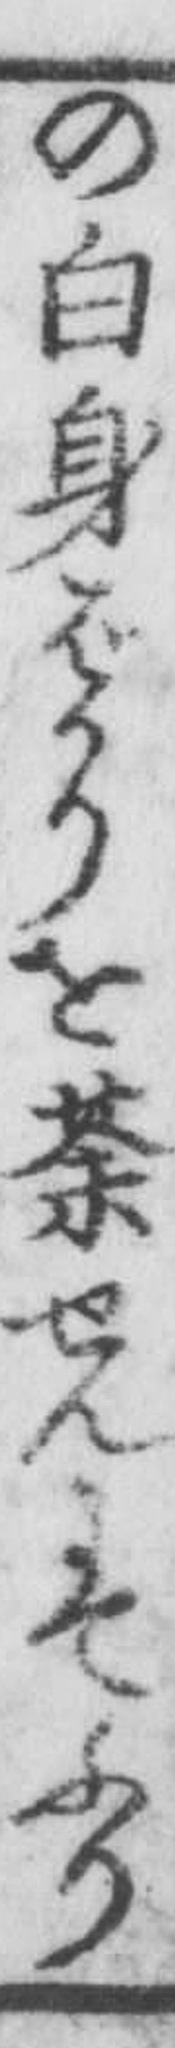の白身ばかりを茶せんにてふり
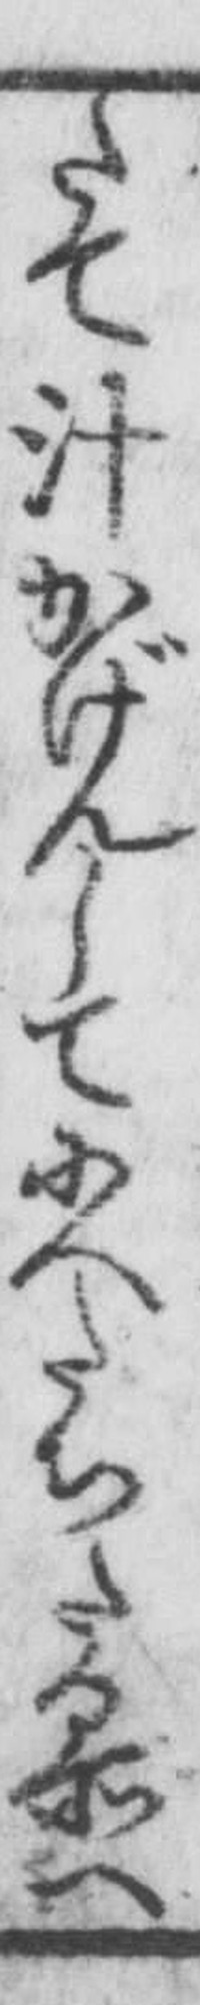たて汁かげんして少たちたる所へ
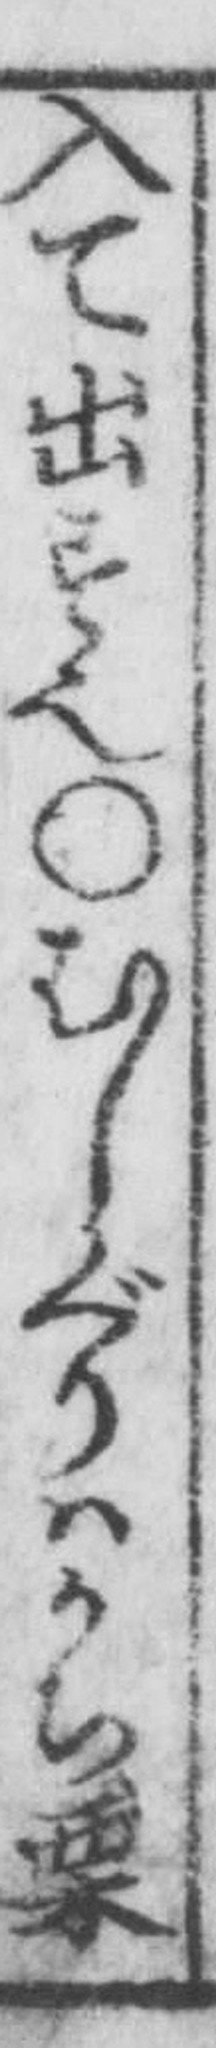入て出す〇むしぐりハかち栗
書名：当世料理筌
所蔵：大阪府立大学学術情報センター 国文学研究資料館
